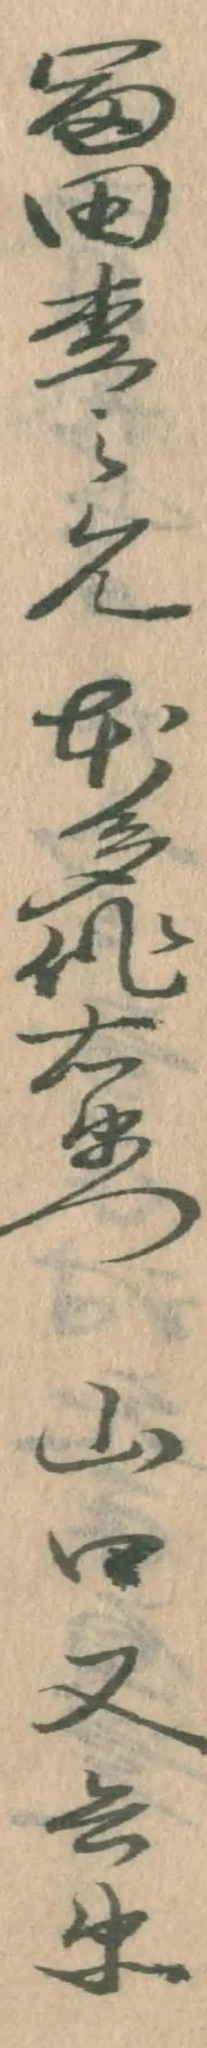冨田杢之允本多作右衛門山口又兵衛
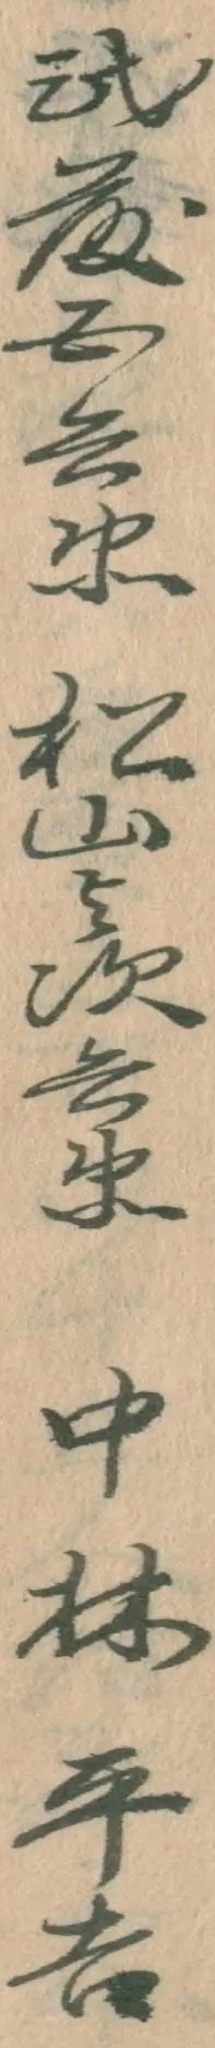武藤五兵衛松山与次兵衛中林平吉
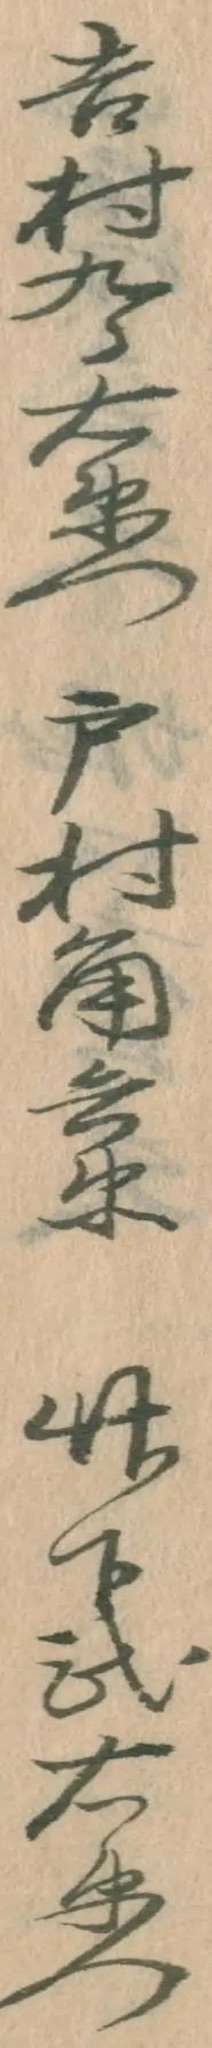吉村九郎右衛門戸村角兵衛竹下武右衛門

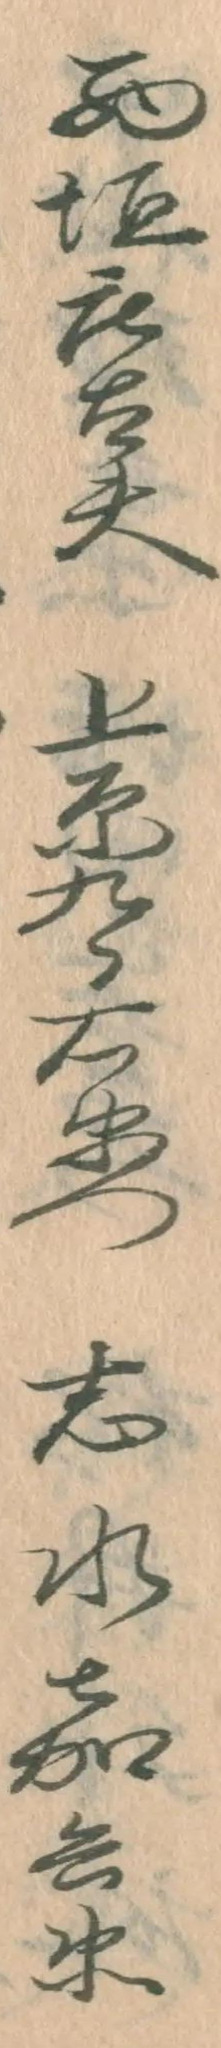西垣庄太夫上原九郎右衛門志水嘉兵衛
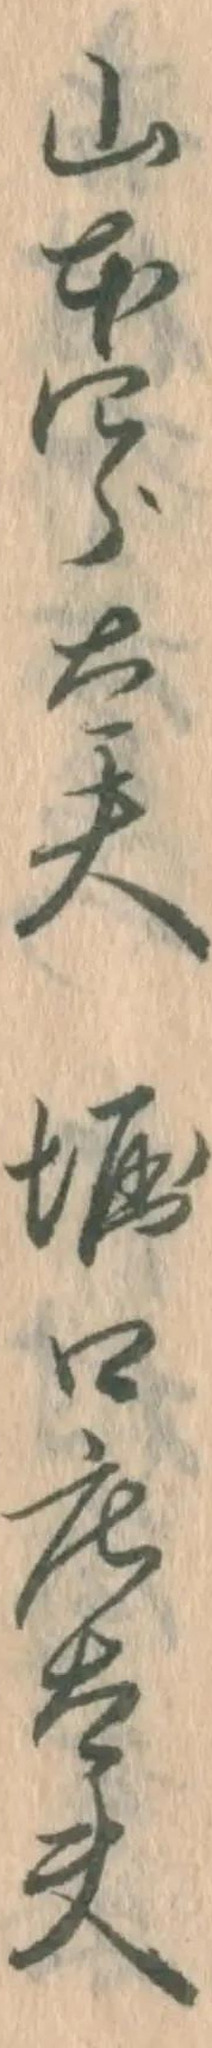山本四郎太夫堀口庄太夫
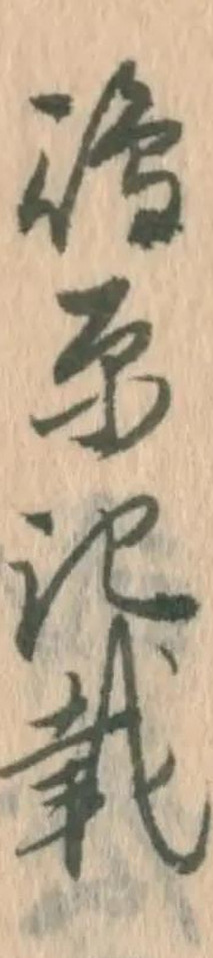島原記載
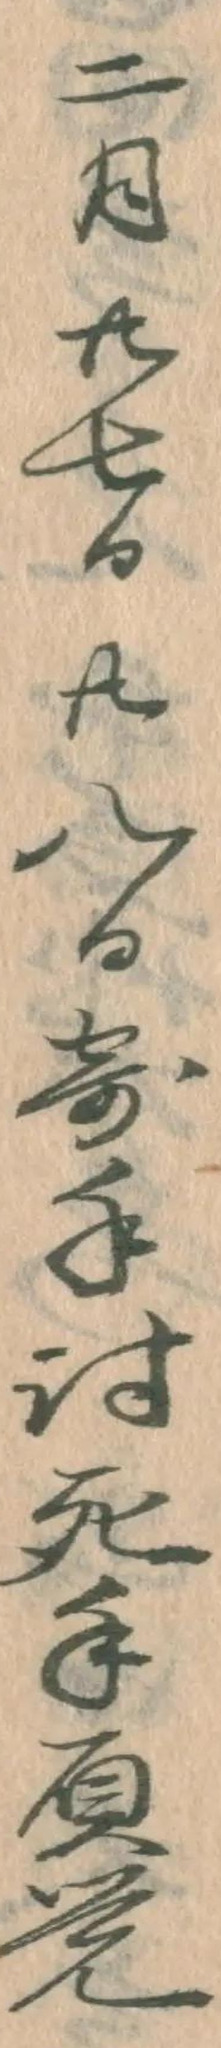二月廿七日廿八日寄手討死手負覚
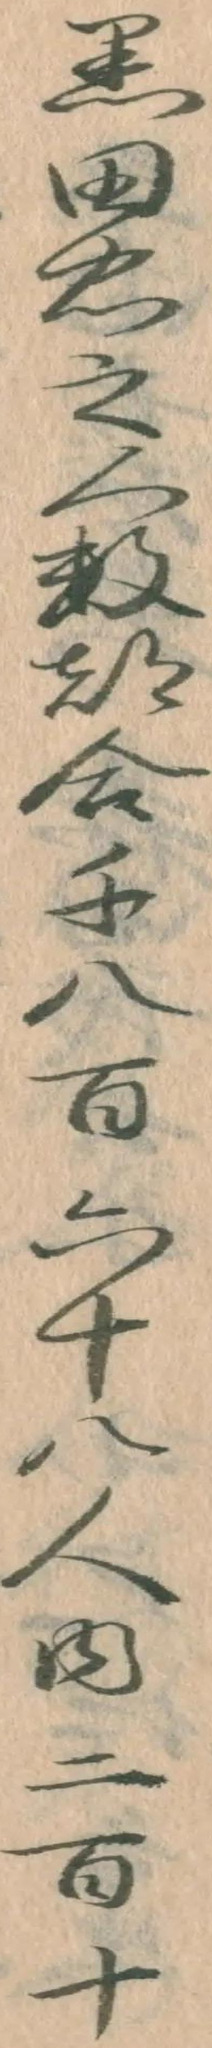黒田忠之人数都合千八百六十八人内二百十
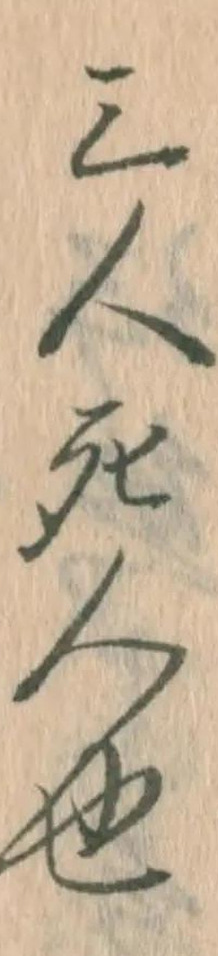三人死人也
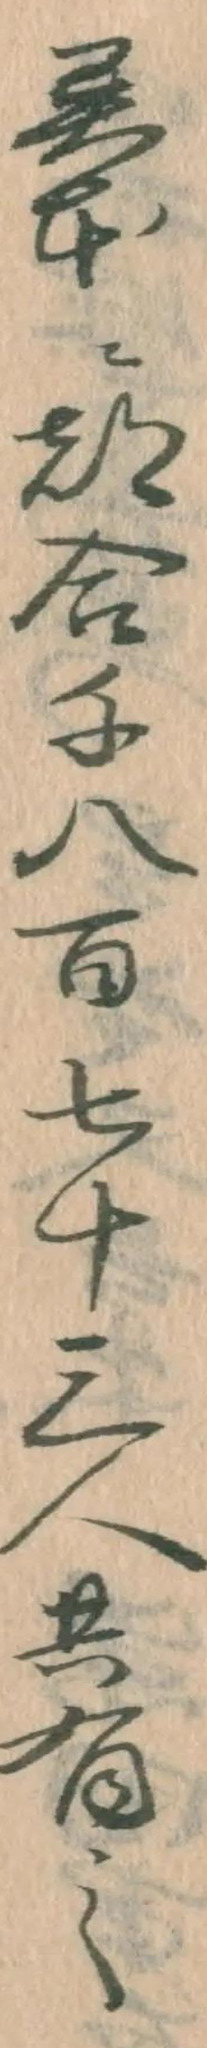異本に都合千八百七十三人共有之
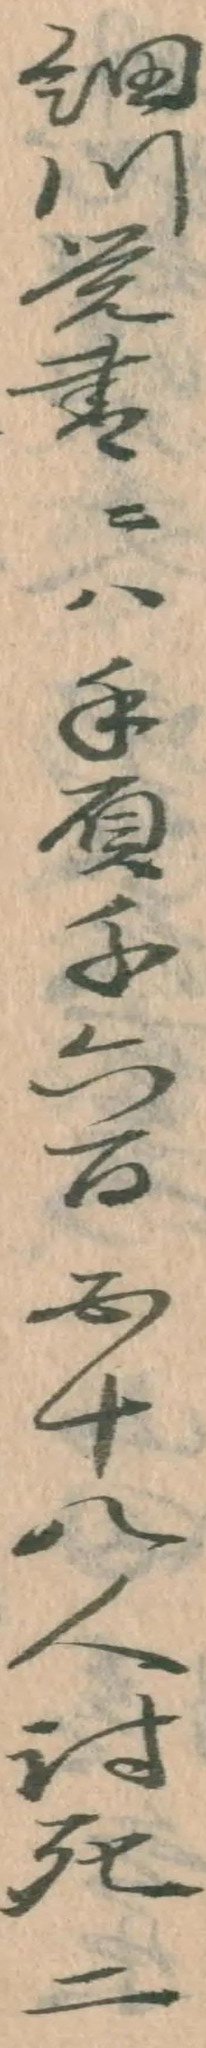細川覚書には手負千六百五十八人討死二
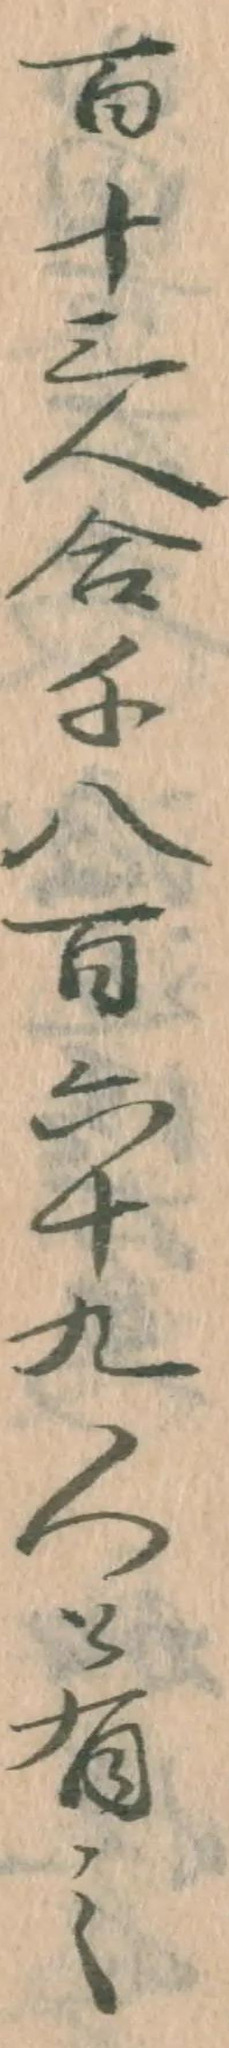百十三人合千八百六十九人と有之
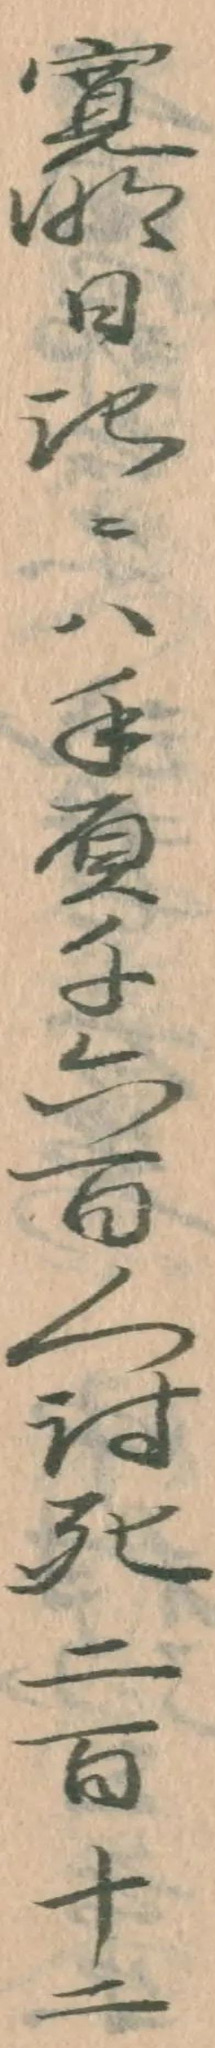寛明日記には手負千六百人討死二百十二
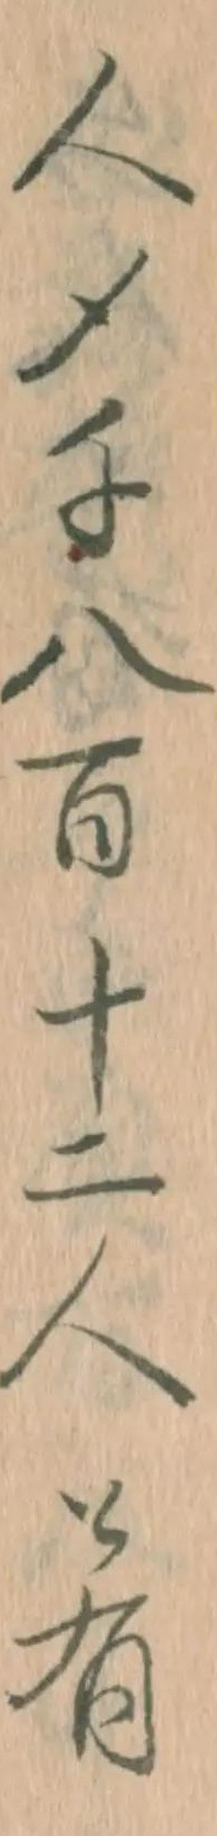人〆千八百十二人と有
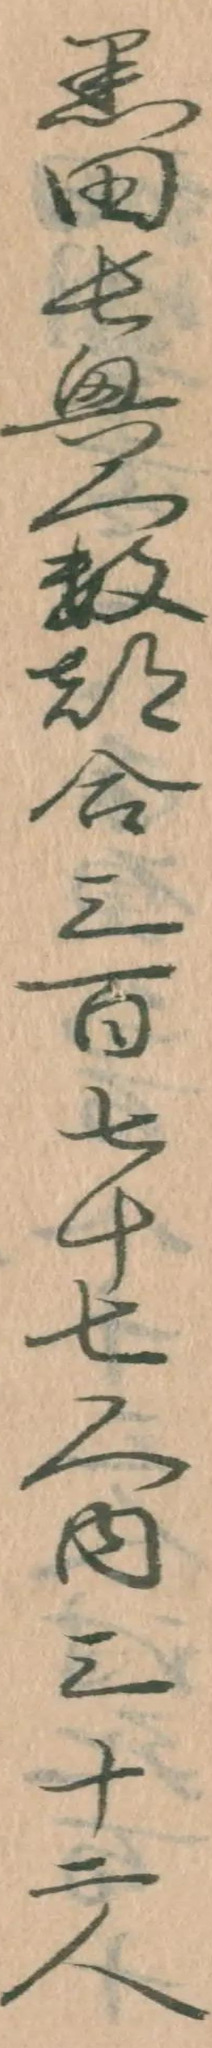黒田長興人数都合三百七十七人内三十三人
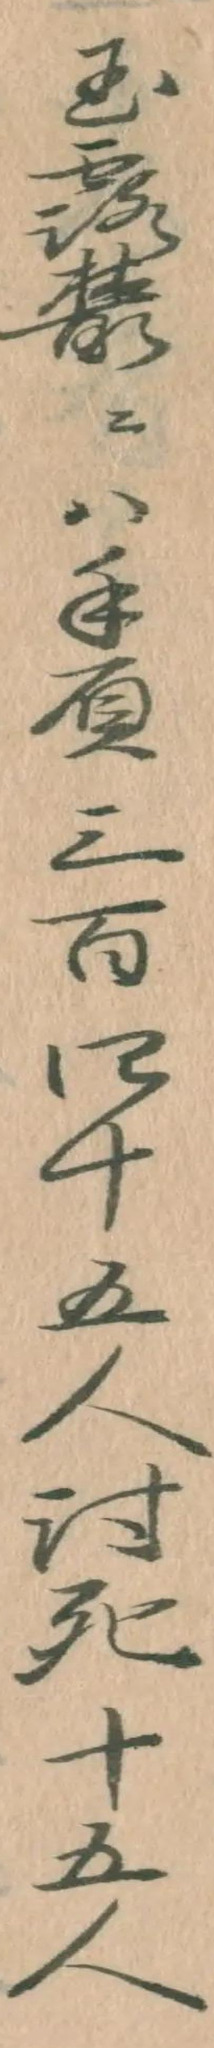玉露樷には手負三百四十五人討死十五人
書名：切支丹御退治記 49巻. [9]
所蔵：国立国会図書館 National Diet Library, JAPAN
